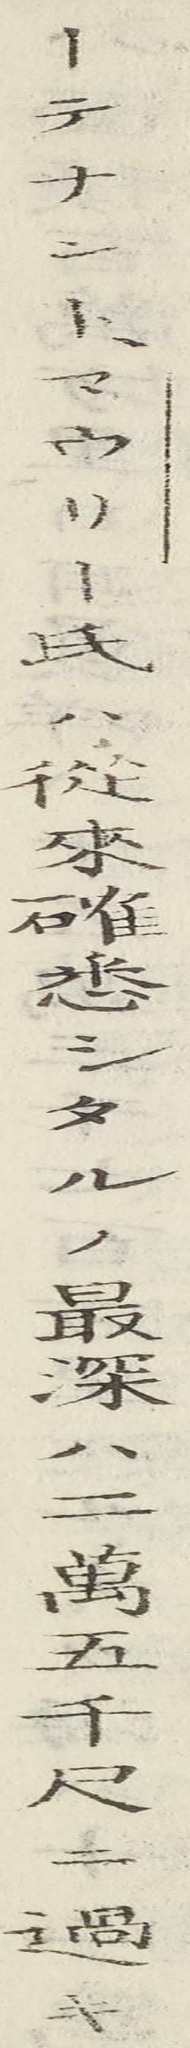ーテナント、マウリー氏ハ従来確悉シタルノ最深ハ二万五千尺ニ過キ
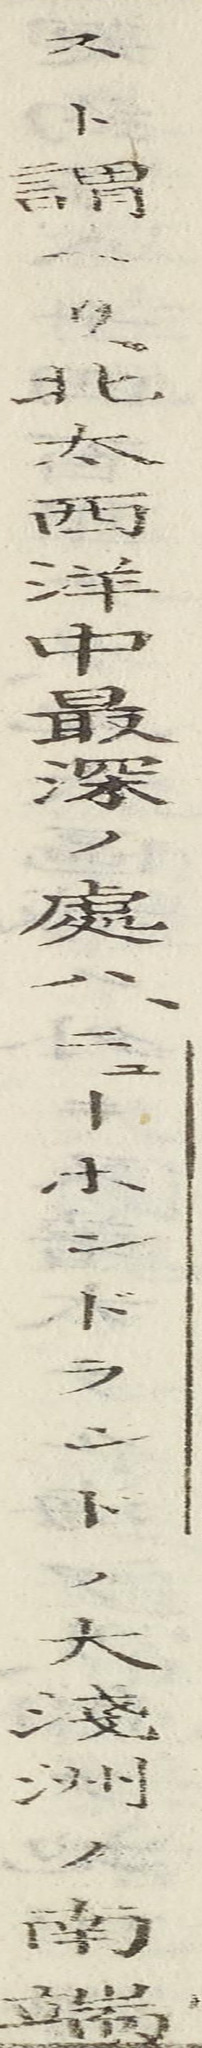スト謂ヘリ、北太西洋中最深ノ処ハ、ニューホンドラントノ大浅洲ノ南端
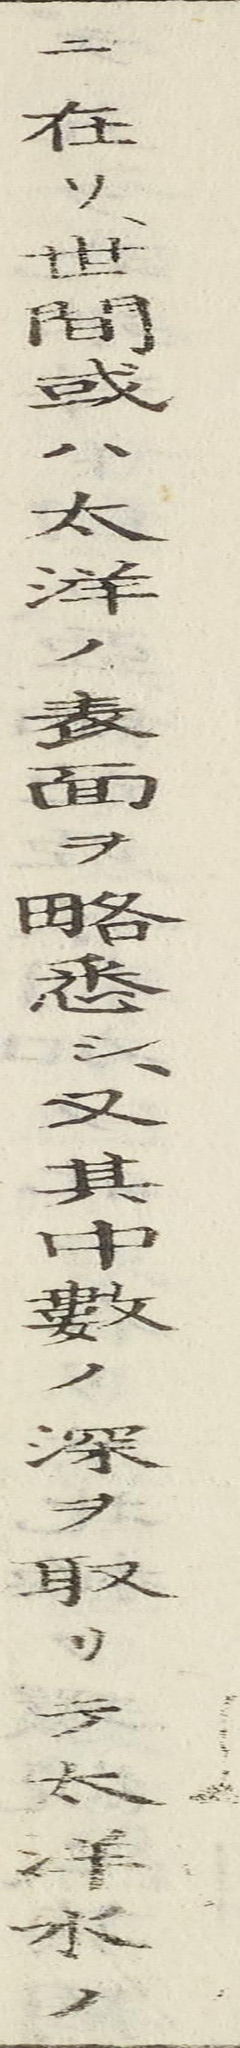ニ在リ、世間或ハ太洋ノ表面ヲ略悉シ、又其中数ノ深ヲ取リテ太洋水ノ
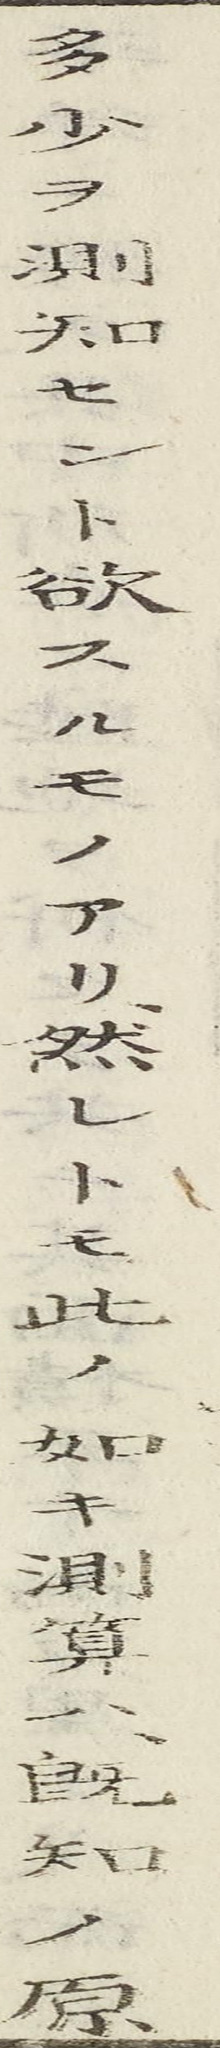多少ヲ測知セント欲スルモノアリ、然レトモ此ノ如キ測算ハ、既知ノ原
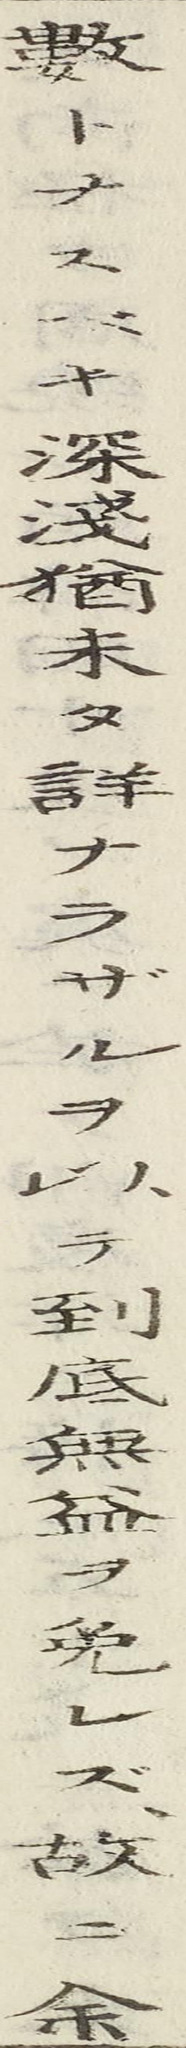数トナスベキ深浅猶未タ詳ナラザルヲ以テ到底無益ヲ免レズ、故ニ余
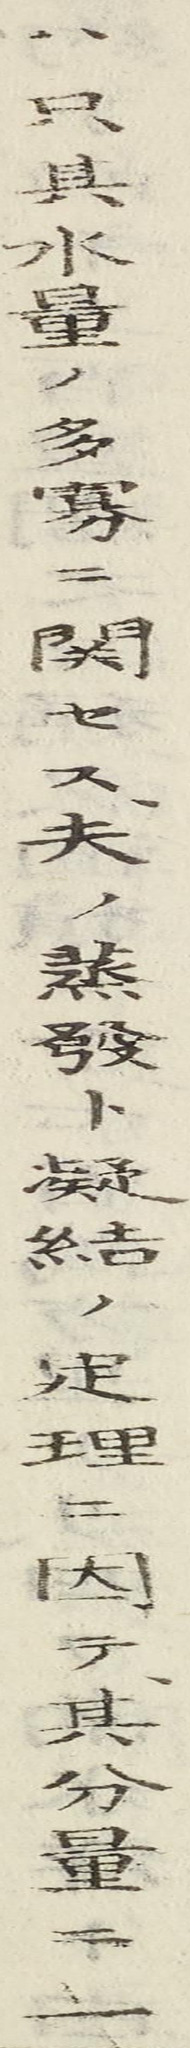ハ只水量ノ多寡ニ関セス、夫ノ蒸発ト凝結ノ定理ニ因テ、其分量ニ一
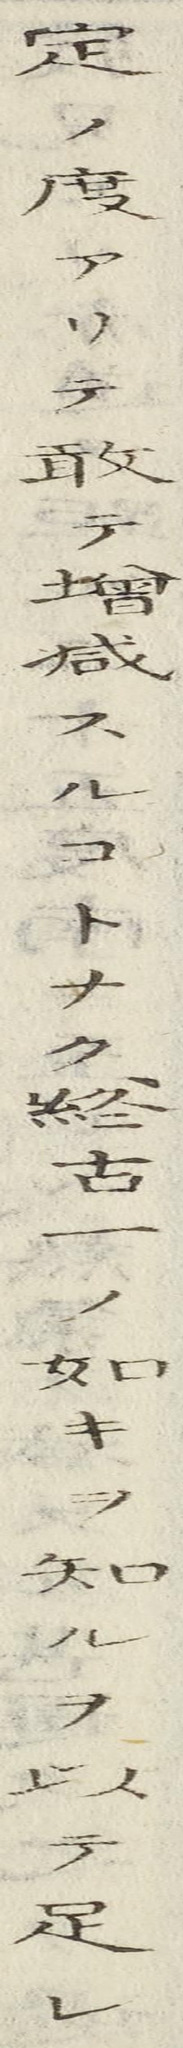定ノ度アリテ敢テ増減スルコトナク、終古一ノ如キヲ知ルヲ以テ足レ
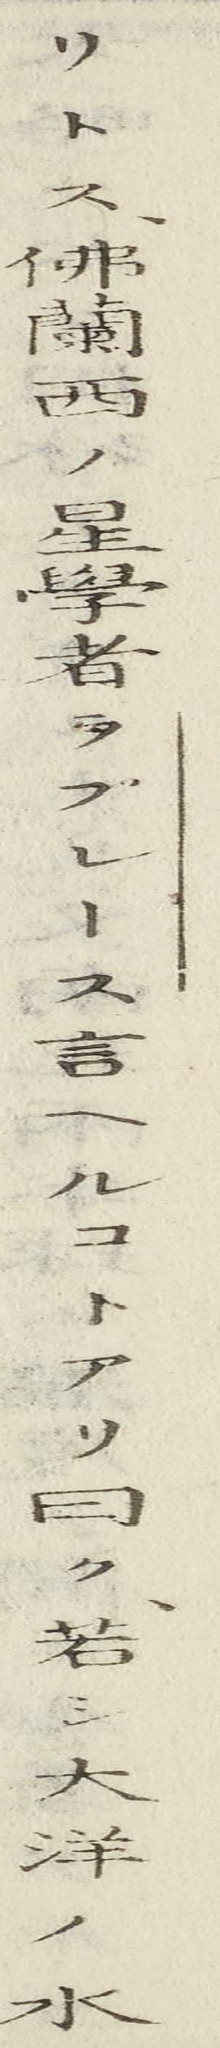リトス、仏蘭西ノ星学者ラプレース言ヘルコトアリ曰ク、若シ大洋ノ水
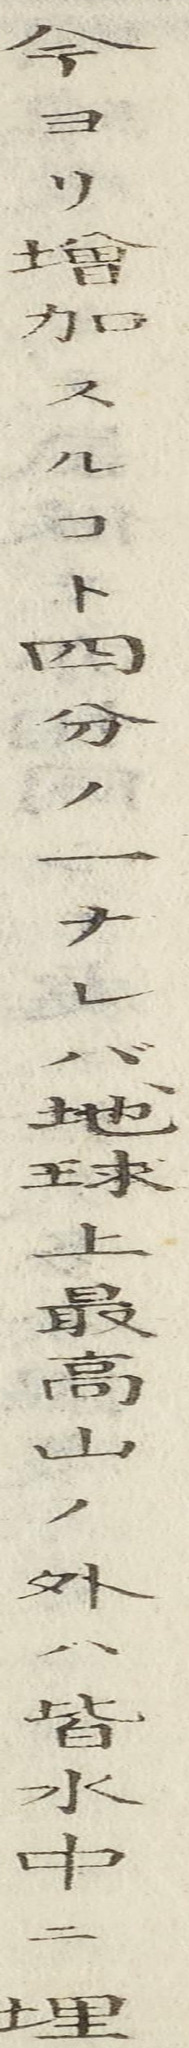今ヨリ増加スルコト四分ノ一ナレバ、地球上最高山ノ外ハ皆水中ニ埋
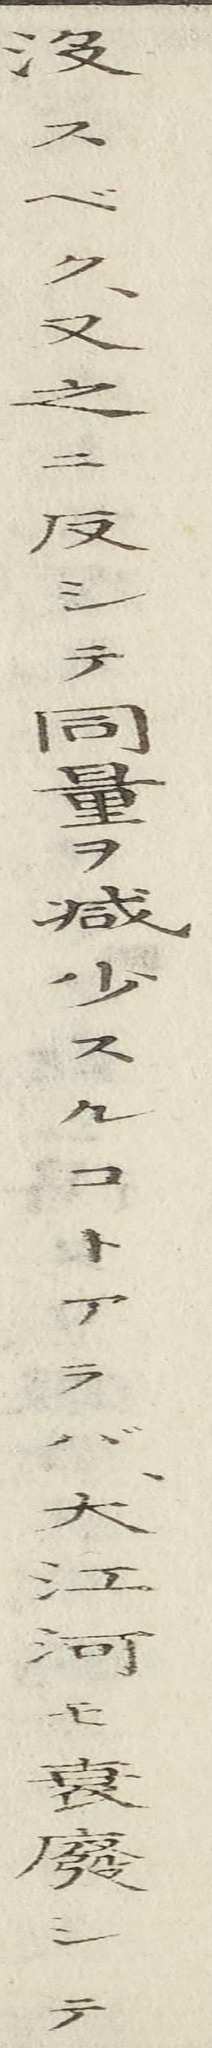没スベク、又之ニ反シテ同量ヲ減少スルコトアラバ、大江河モ衰廃シテ
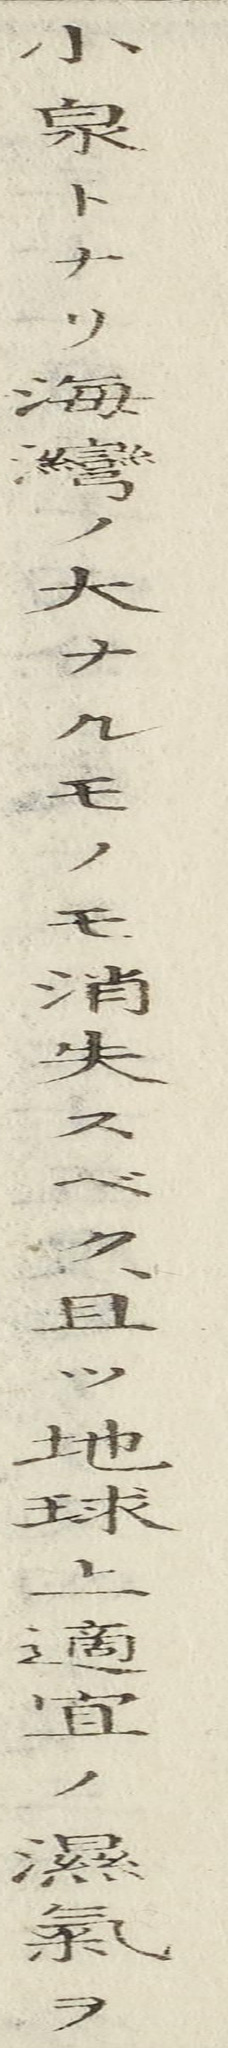小泉トナリ海湾ノ大ナルモノモ消失スベク、且ツ地球上適宜ノ湿気ヲ
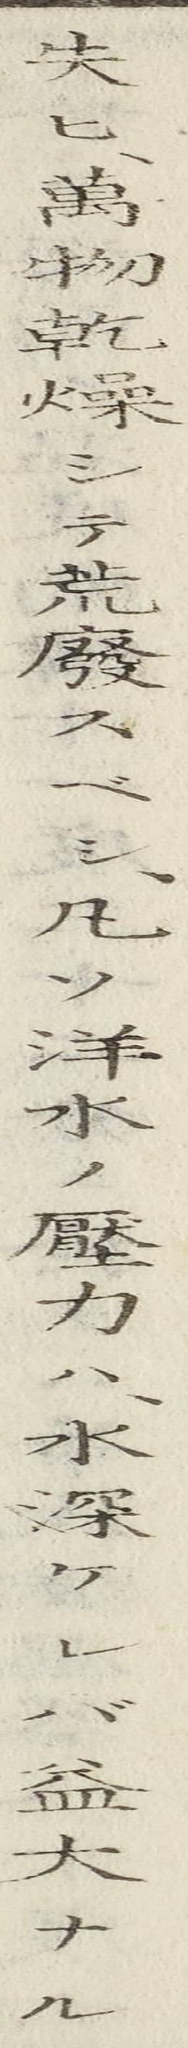失ヒ、万物乾燥シテ荒廃スベシ、凡ソ洋水ノ圧力ハ、水深ケレバ益大ナル
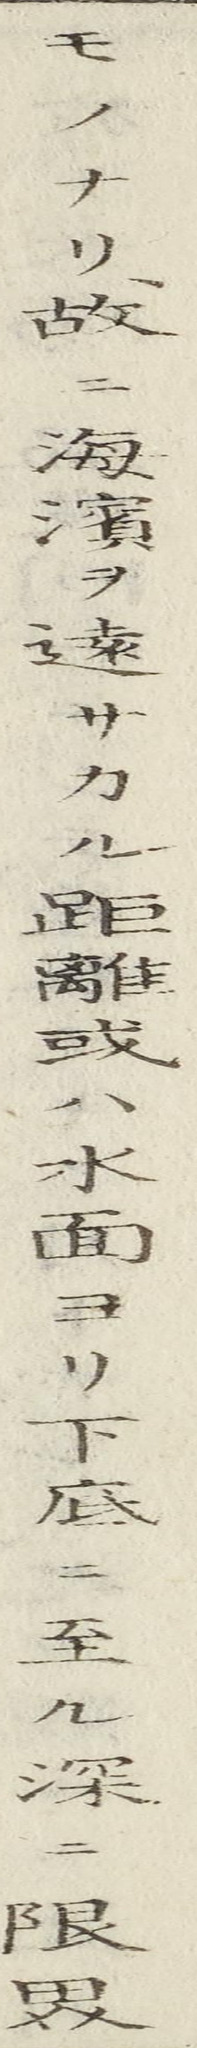モノナリ、故ニ海浜ヲ遠サカル距離或ハ水面ヨリ下底ニ至ル深ニ限界
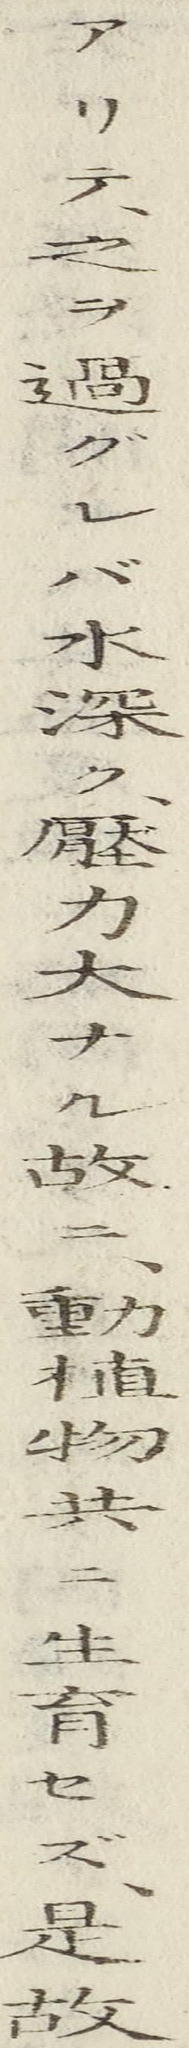アリテ、之ヲ過グレバ水深ク、圧力大ナル故ニ、動植物共ニ生育セズ、是故
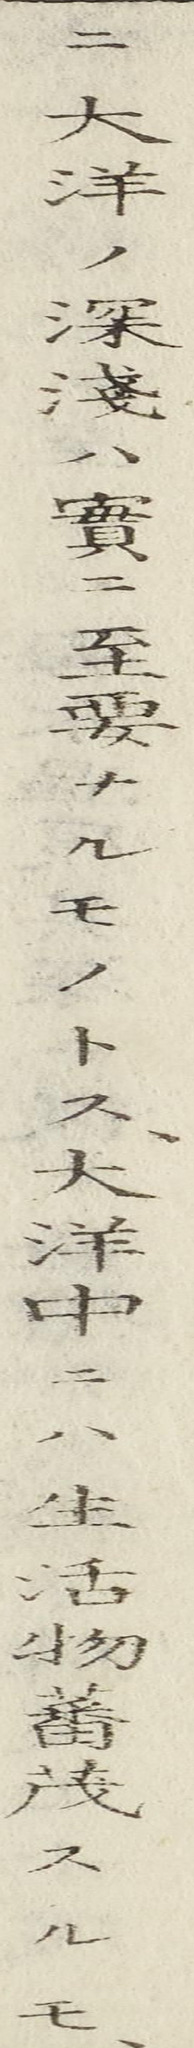ニ大洋ノ深浅ハ実ニ至要ナルモノトス、大洋中ニハ生活物蕃茂スルモ、
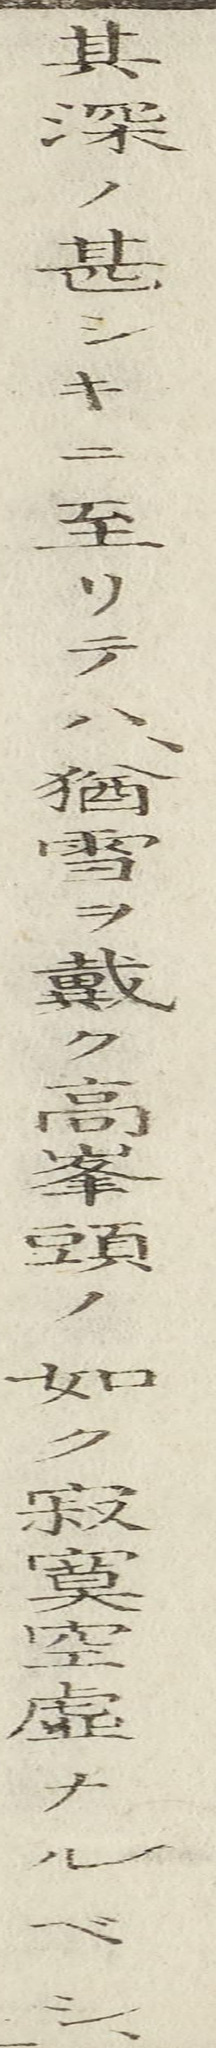其深ノ甚シキニ至リテハ、猶雪ヲ戴ク高峯頭ノ如ク寂寞空虚ナルベシ、」
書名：百科全書　地文學　全
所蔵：東京大学地震研究所図書室 Earthquake Research Institute Library, The University of Tokyo, JAPAN
